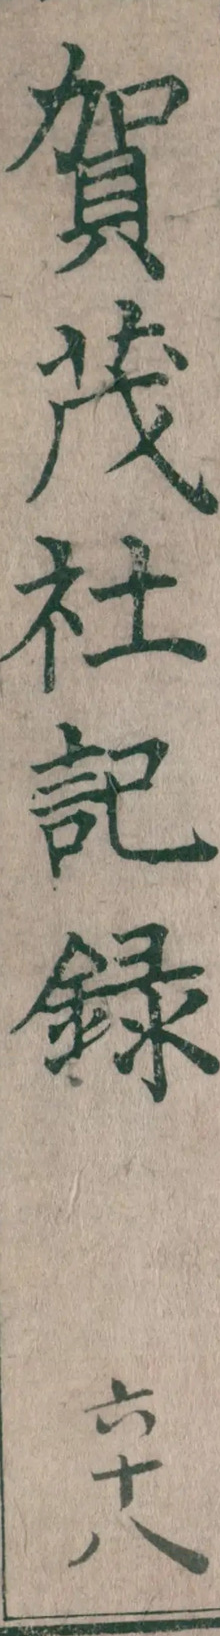賀茂社記録六十八

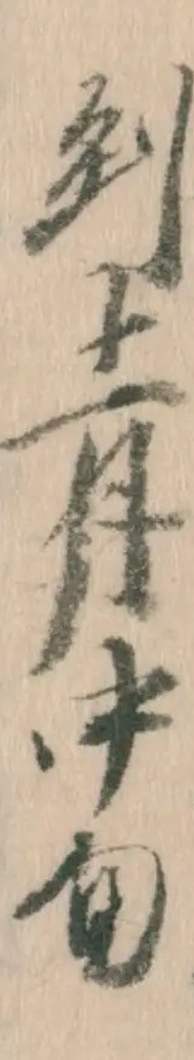到十一月中旬
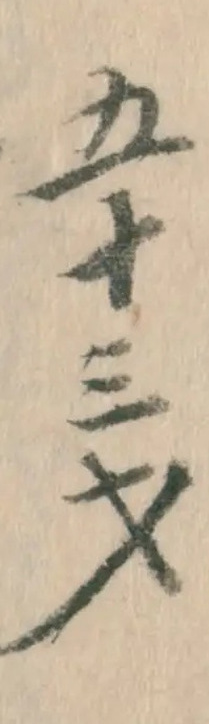五十三才
